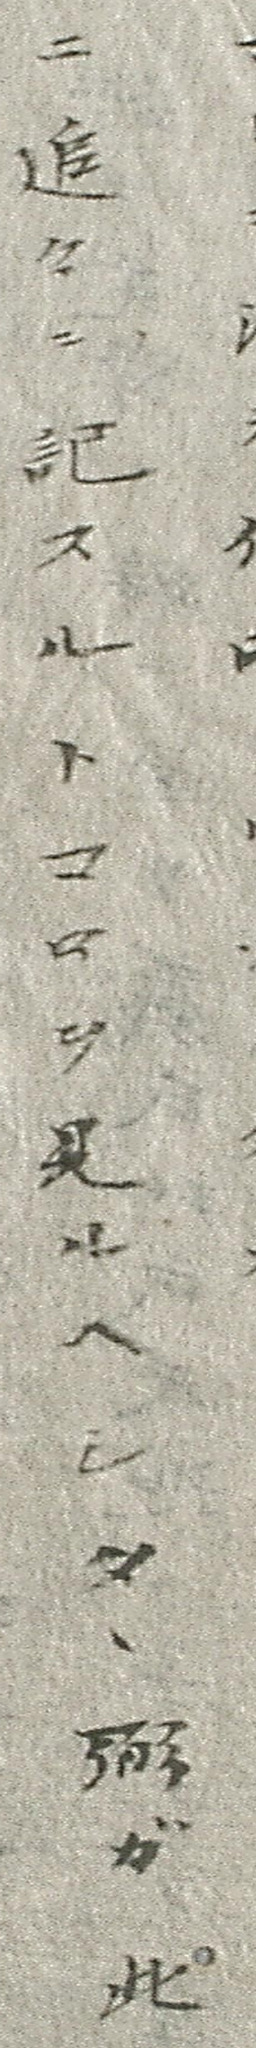ニ追々ニ記スルトコロヲ見ルヘシタヽ弼ガ此
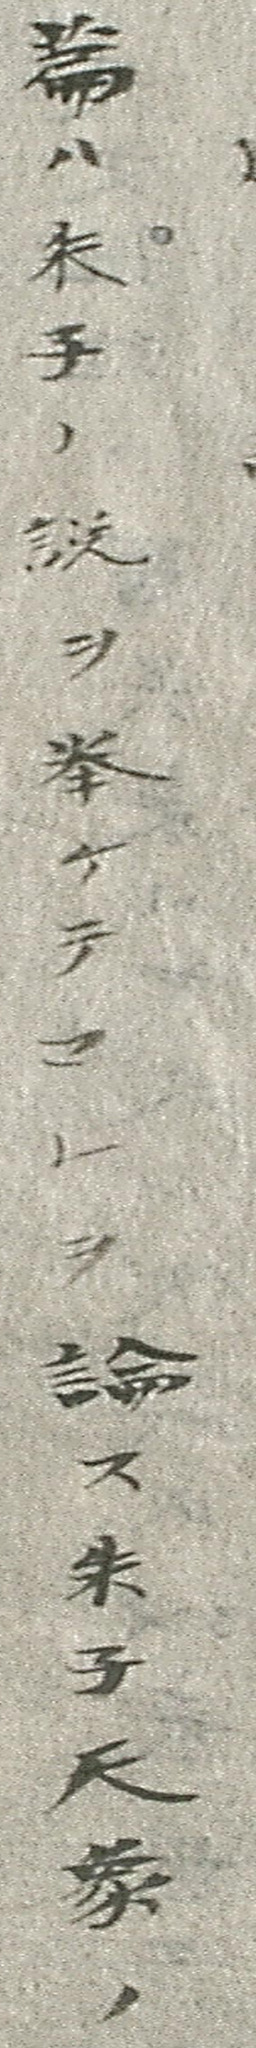篇ハ朱子ノ説ヲ挙ケテコレヲ論ス朱子天蒙ノ
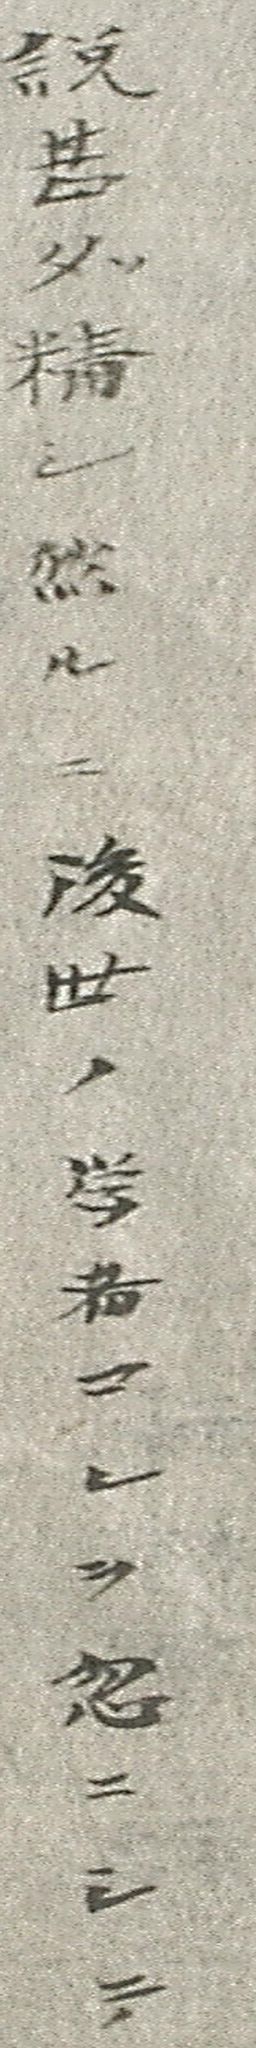説甚ダ精シ然ルニ後世ノ学者コレヲ忽ニシテ
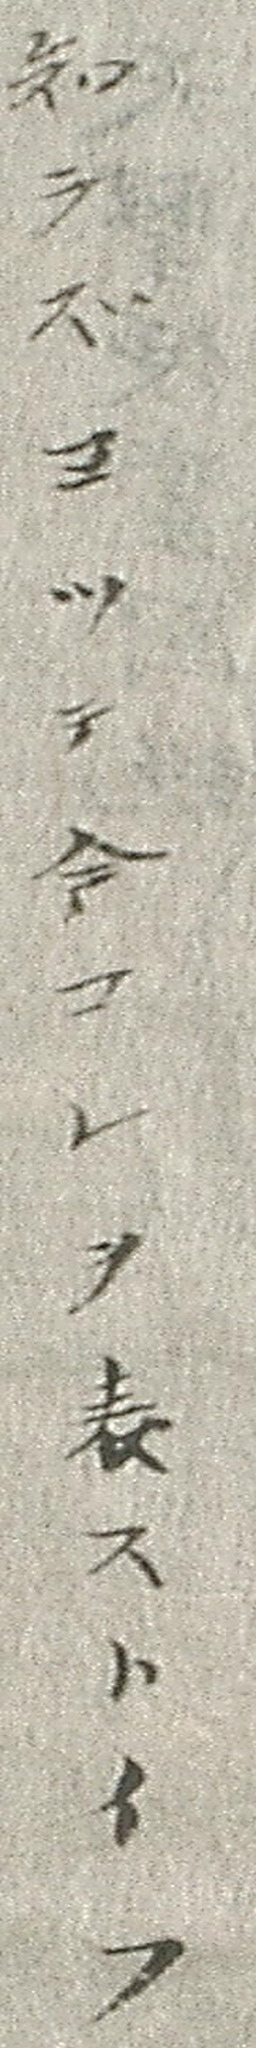知ラズヨツテ今コレヲ表ストイフ
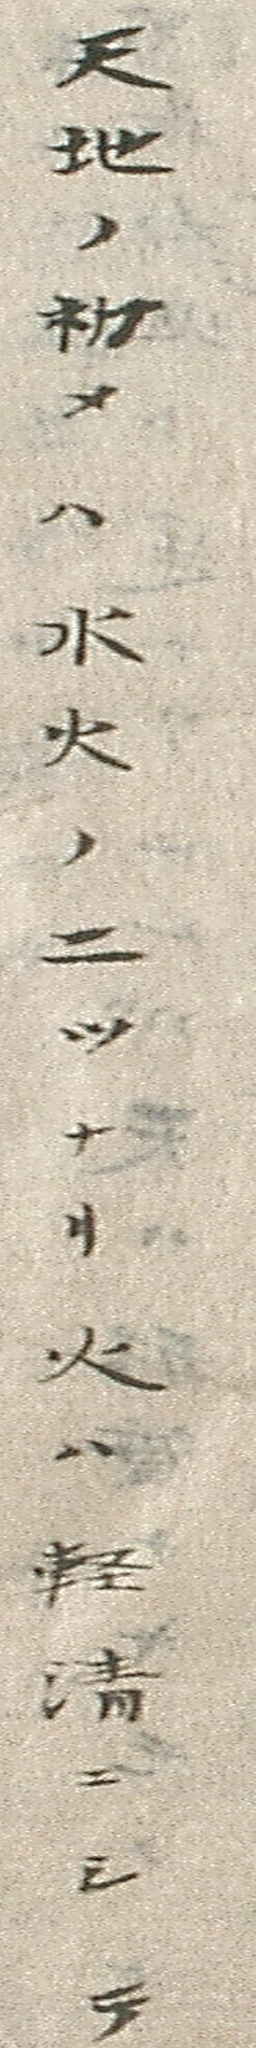天地ノ初メハ水火ノ二ツナリ火ハ軽清ニシテ
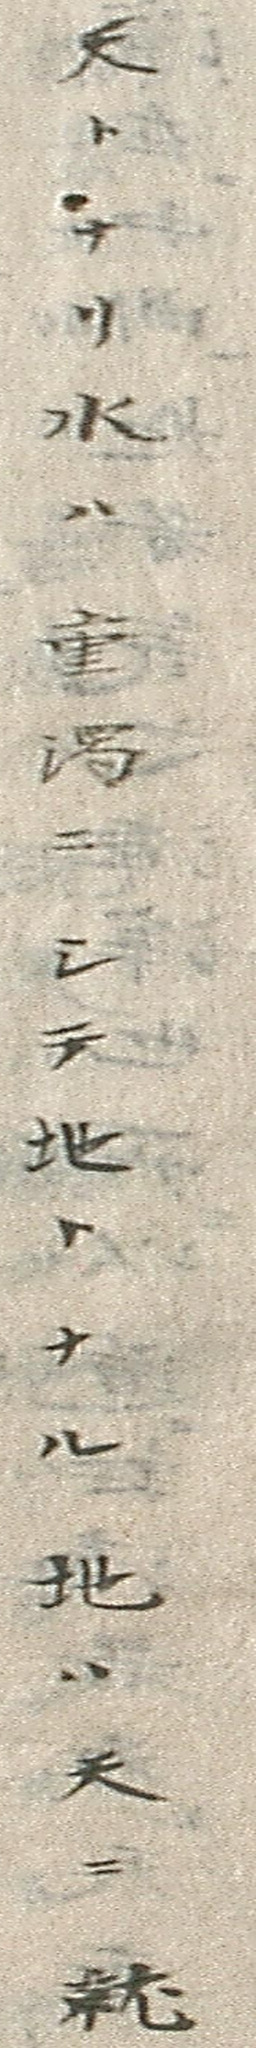天トナリ水ハ重濁ニシテ地トナル地ハ天ニ就
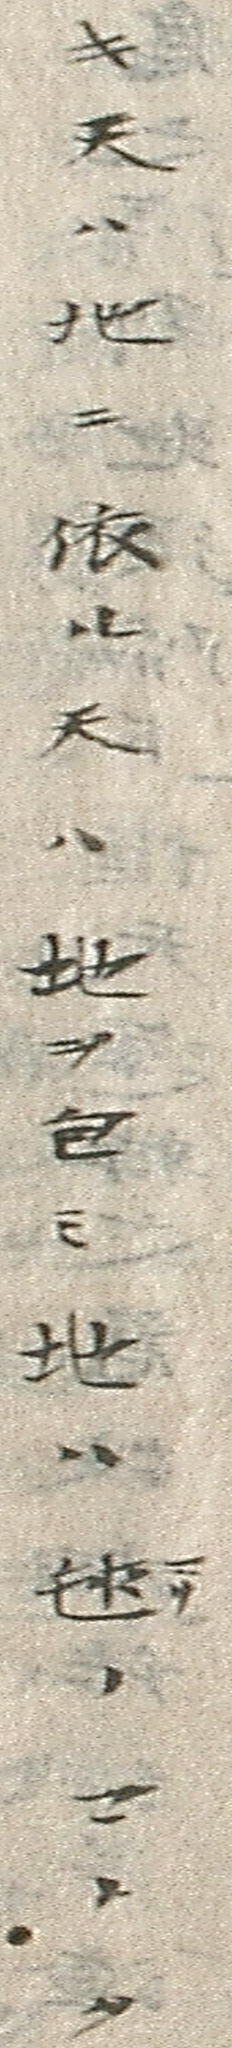キ天ハ地ニ依ル天ハ地ヲ包ミ地ハ毬ノコトク
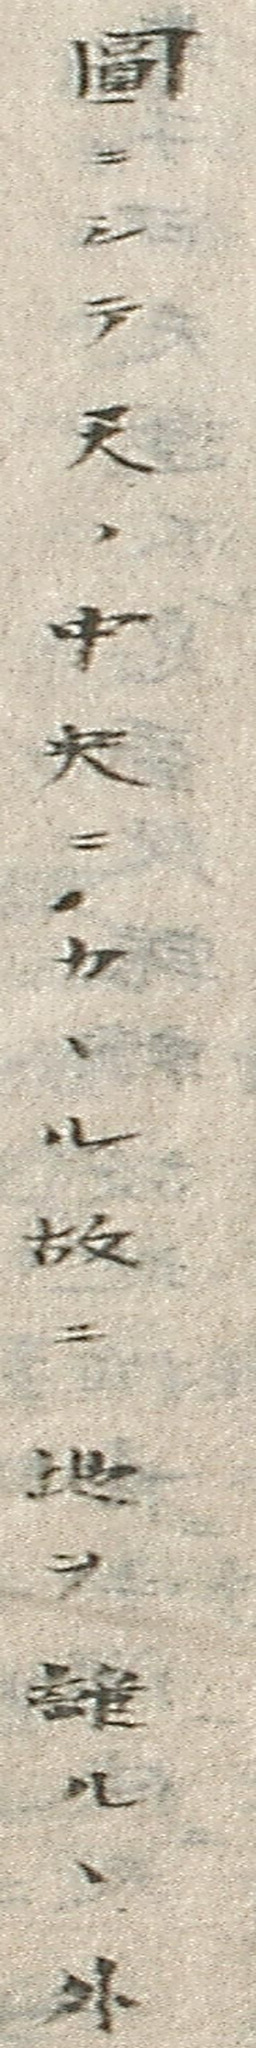円ニシテ天ノ中央ニカヽル故ニ地ヲ離ルヽ外
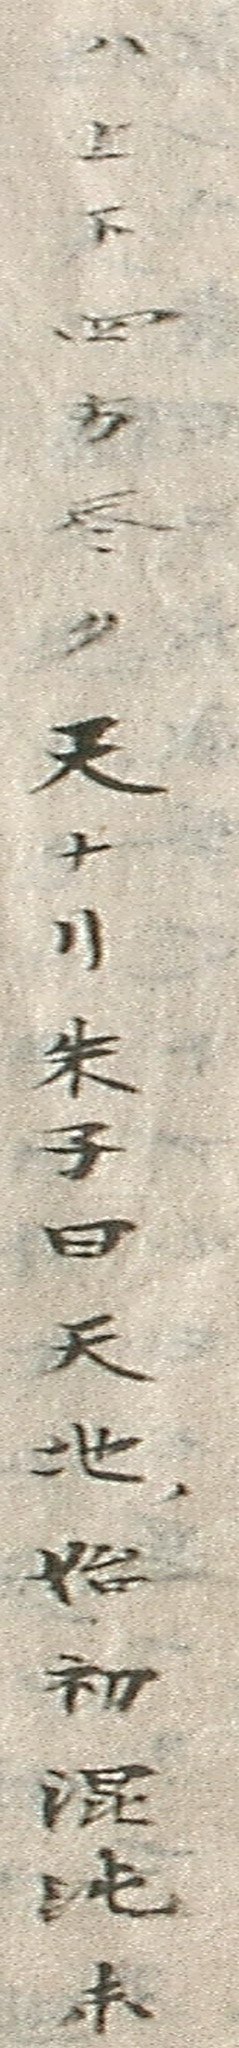ハ上下四方尽ク天ナリ朱子日天地始初混沌未
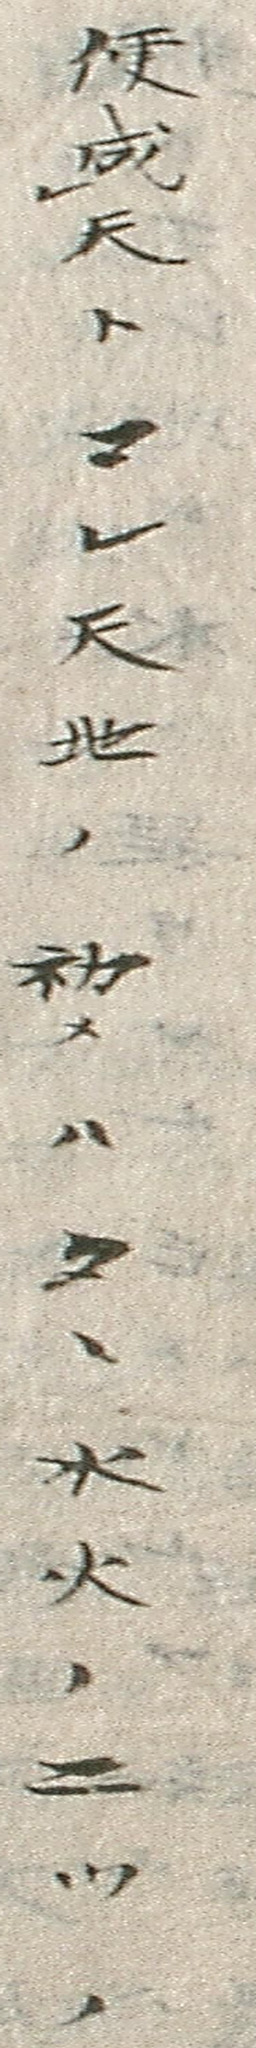便成天トナシ天地ノ初メハタヽ水火ノ二ツノ
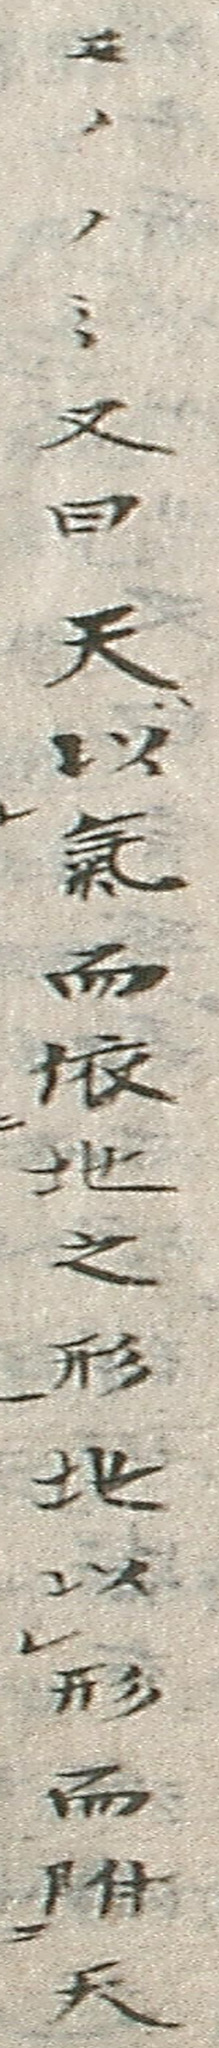モノノミ又日天以気而依ニ地之形地以形而附ニ天
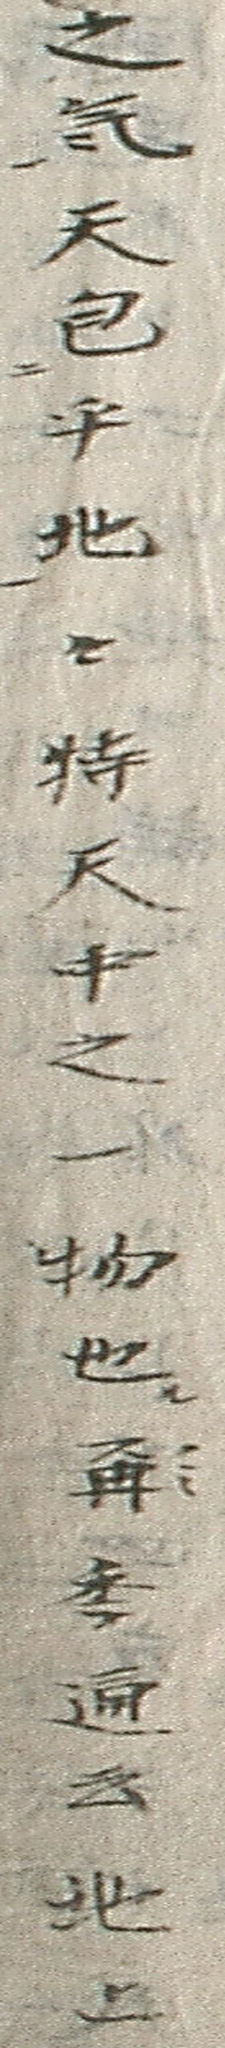之気天包ニ平地々特天中之一物也角季遍云地上

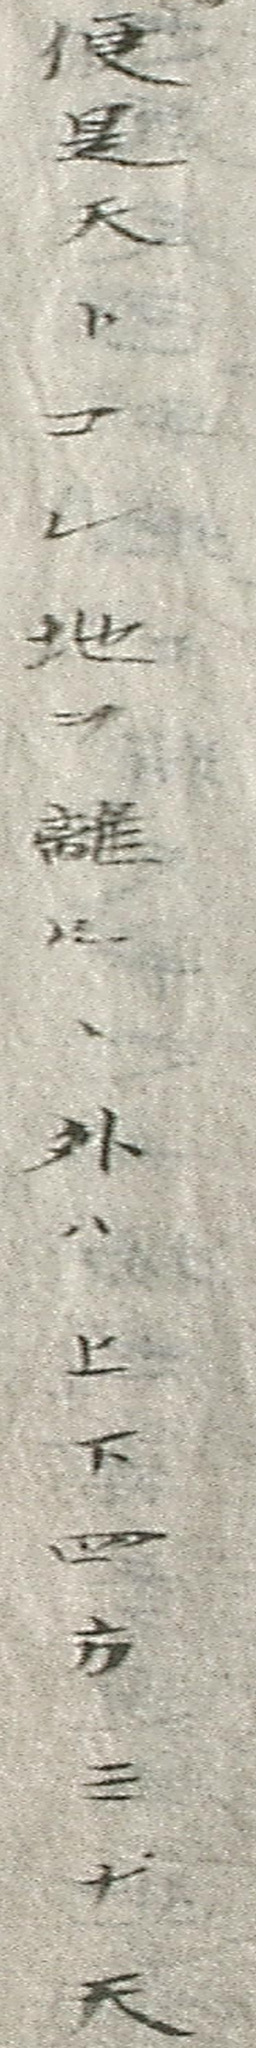便是天トコレ地ヲ離ルヽ外ハ上下四方ミナ天
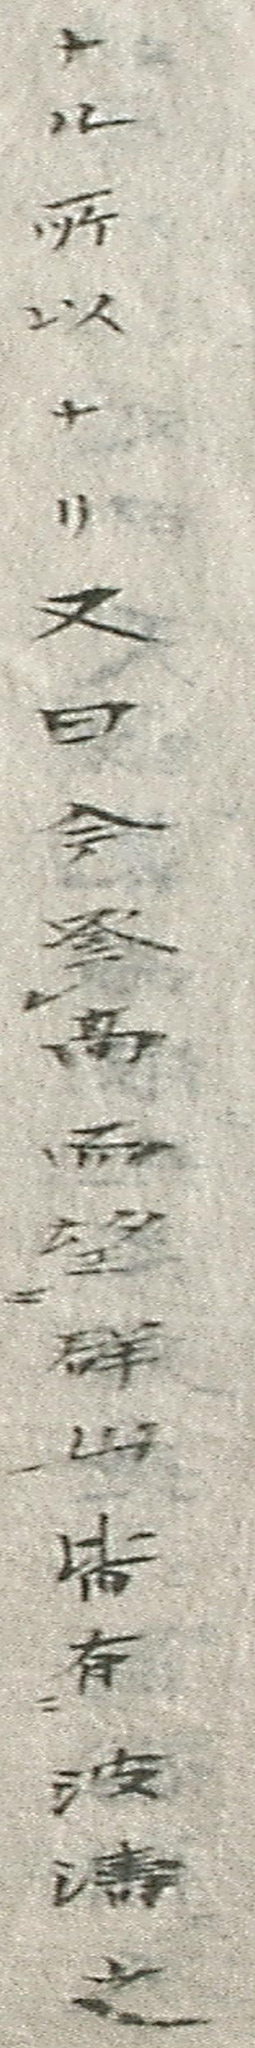ナル所以ナリ又日今登高而望ニ群山皆有ニ波濤之
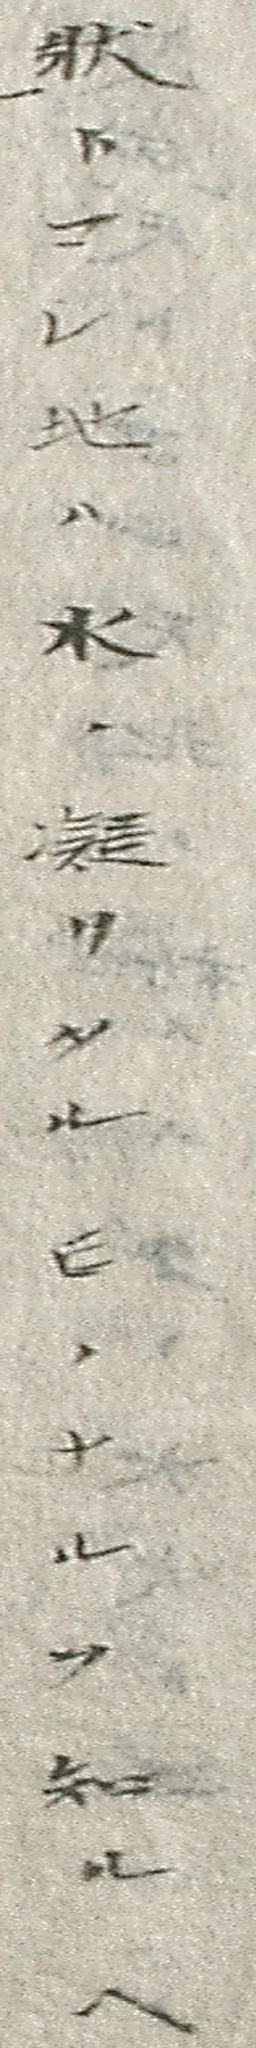状トコレ地ハ水ノ凝リタルモノナルヲ知ルヘ
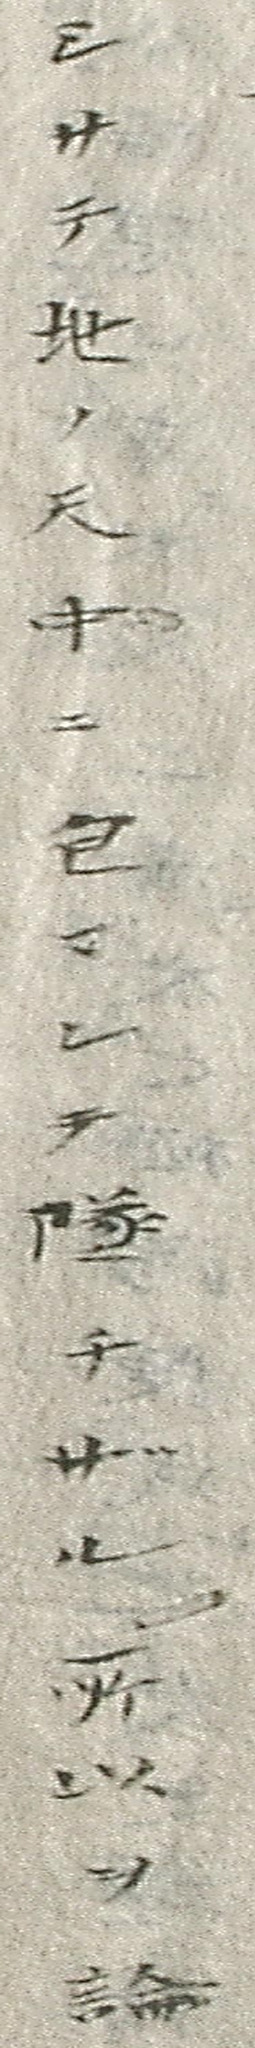シサテ地ノ天中ニ包マレテ墜チザル所以ヲ論
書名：天學便蒙図説
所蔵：東京大学地震研究所図書室 Earthquake Research Institute Library, The University of Tokyo, JAPAN
